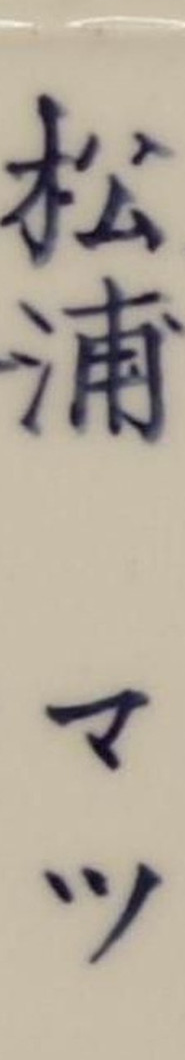松浦マツ
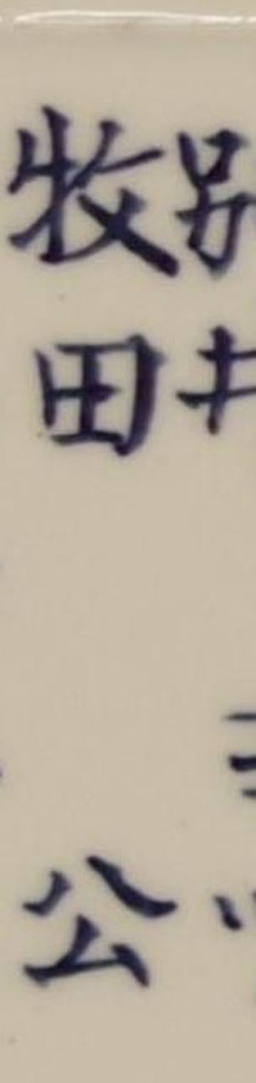牧田公
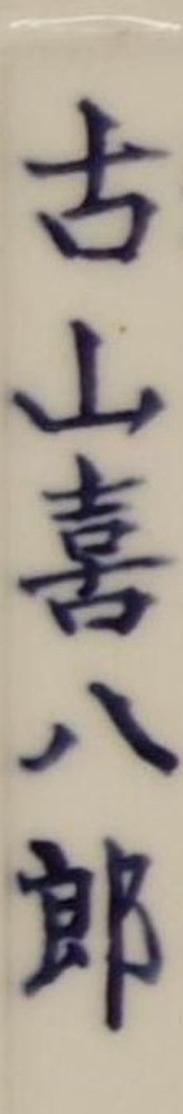古山喜八郎

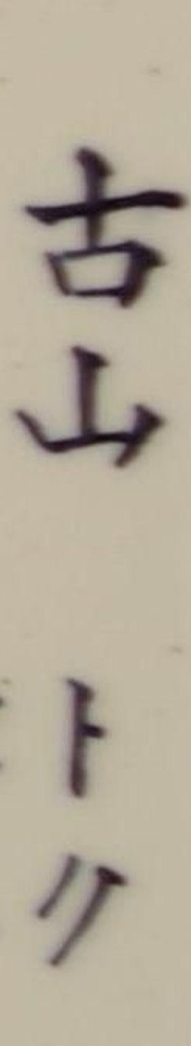古山トク
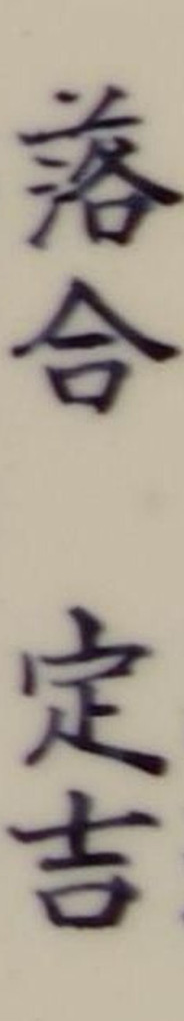落合定吉
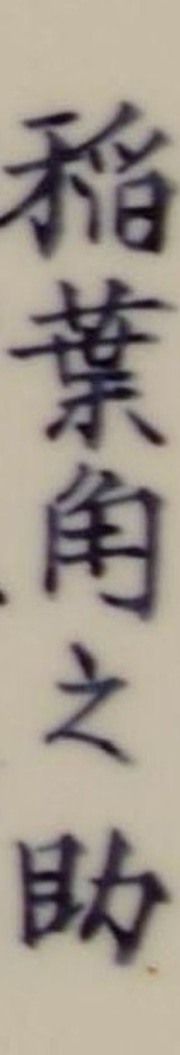稲葉角之助
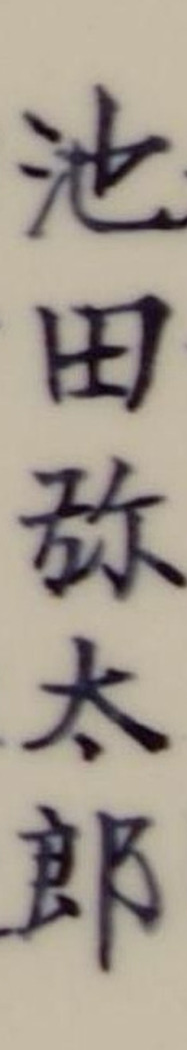池田弥太郎
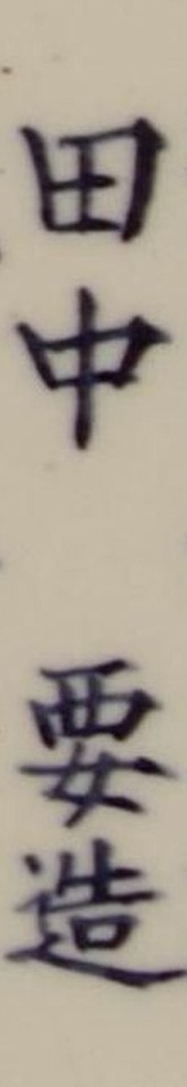田中要造
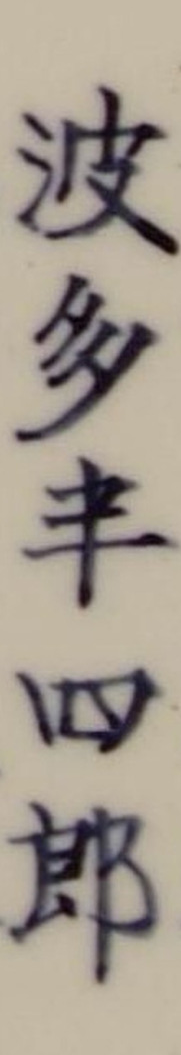波多半四郎
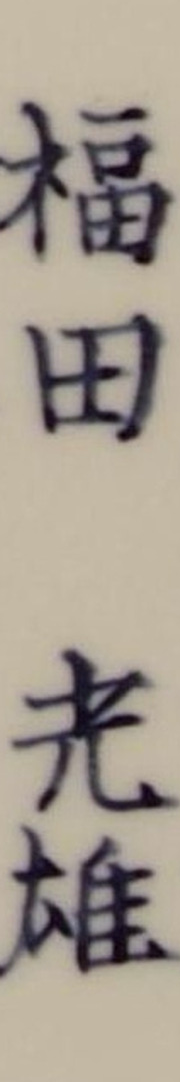福田光雄
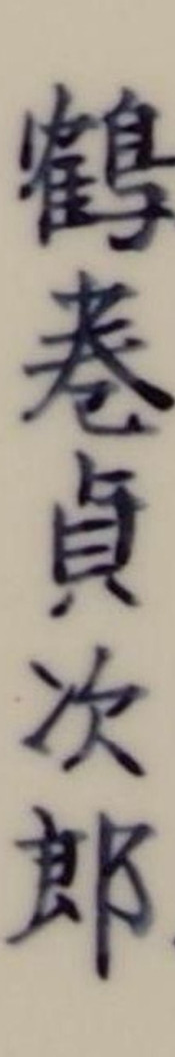鶴巻貞次郎
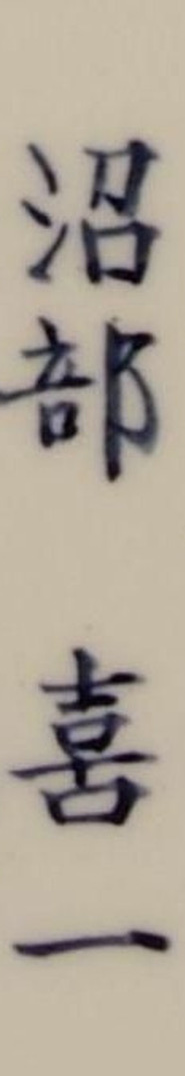沼部喜一
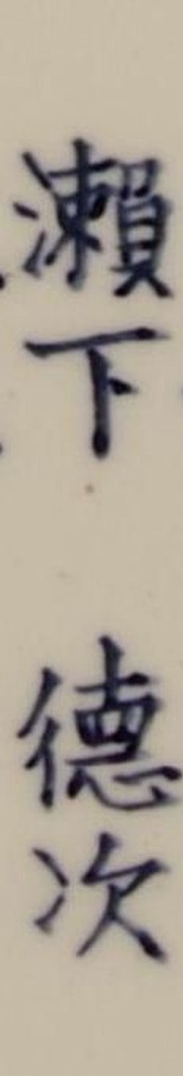瀬下徳次
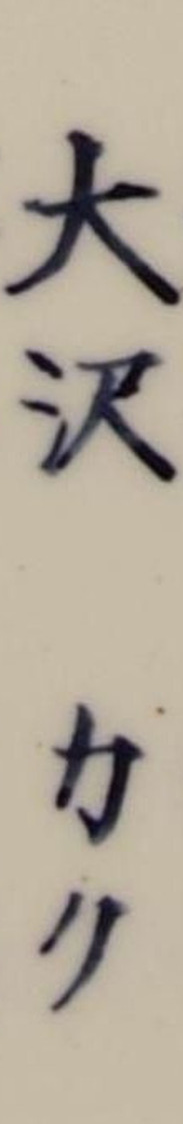大沢カク
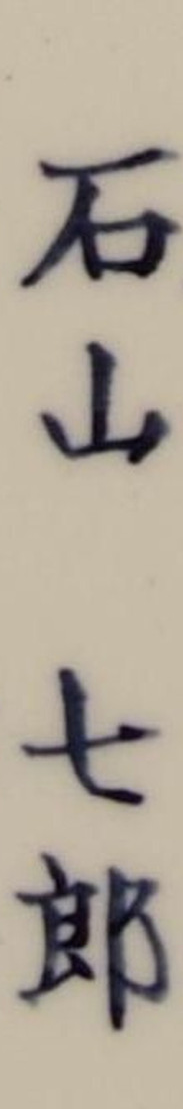石山七郎
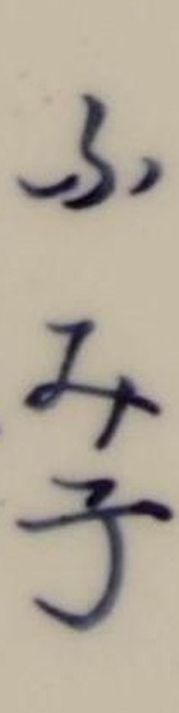ふみ子
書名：E~L
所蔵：高野山金剛峯寺
